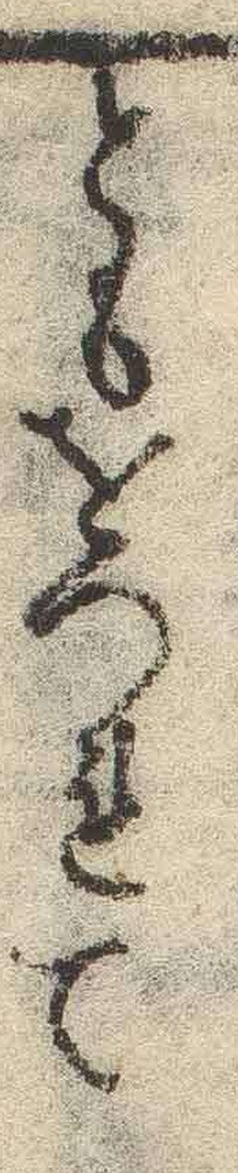ともをつれて
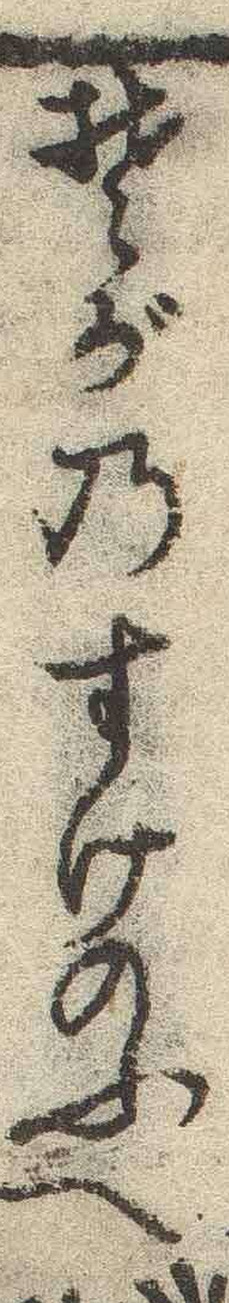そがのすけのふへ
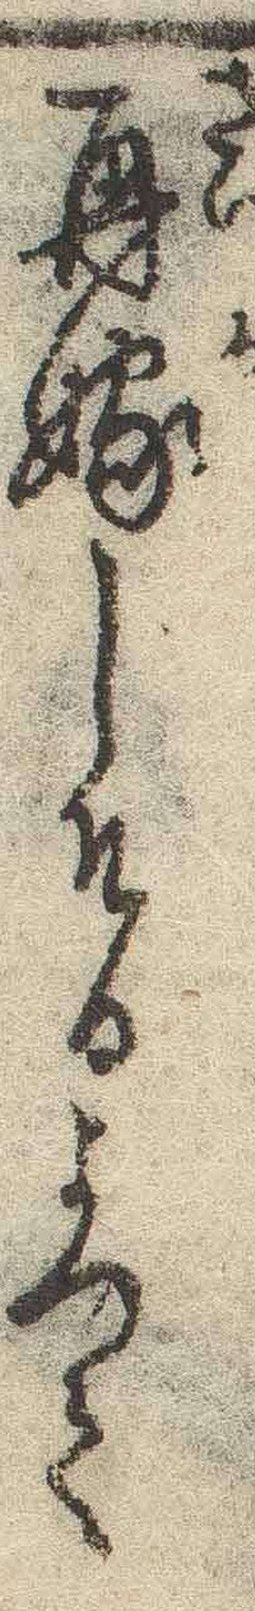再嫁しけるよつて
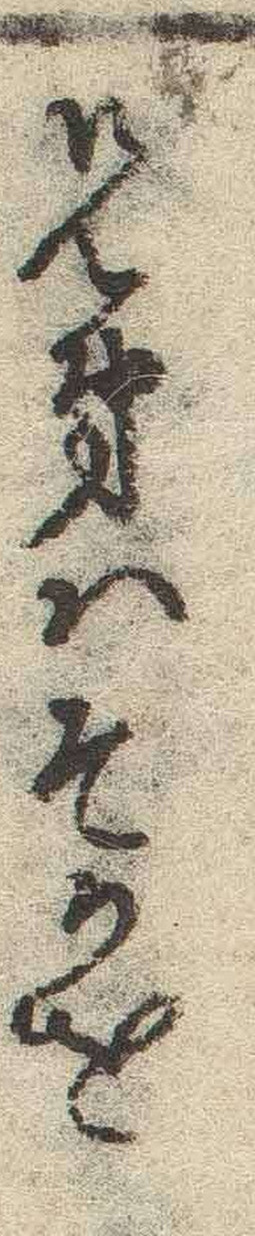兄弟はそかを
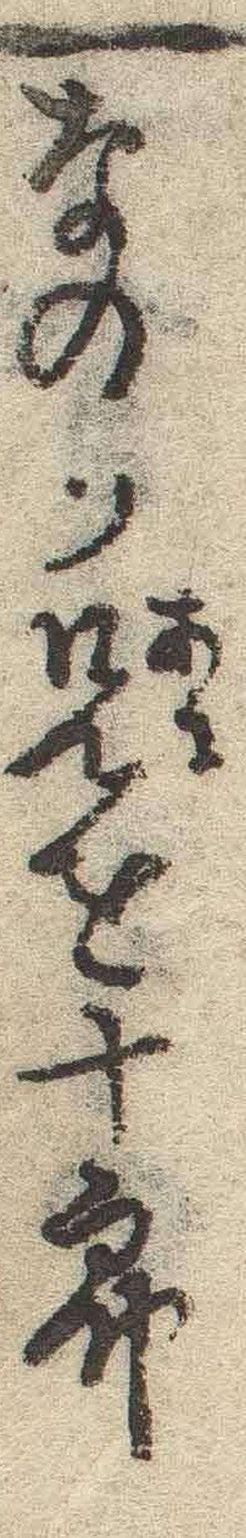なのり兄を十郎
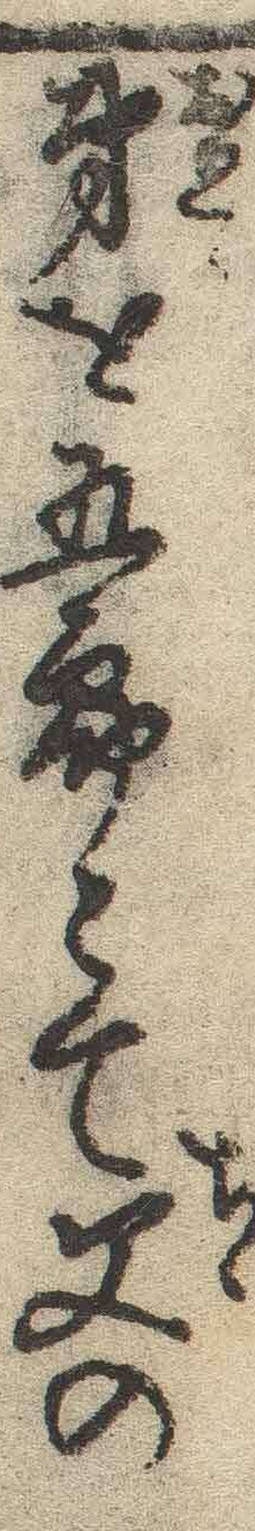弟を五郎とて父の
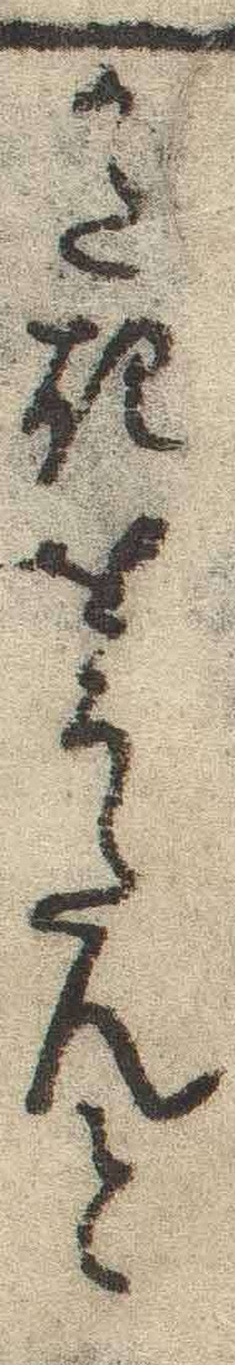かたきをうたんと
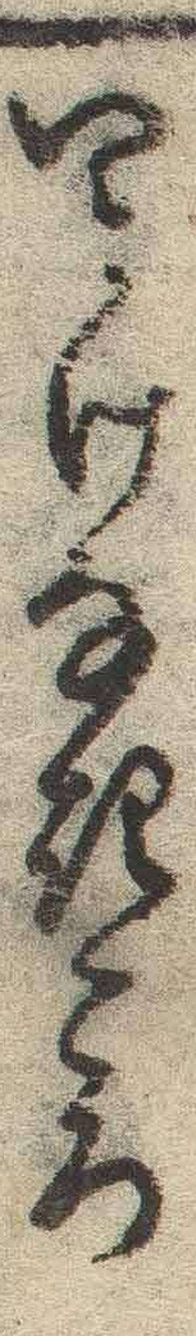いとけなきころ
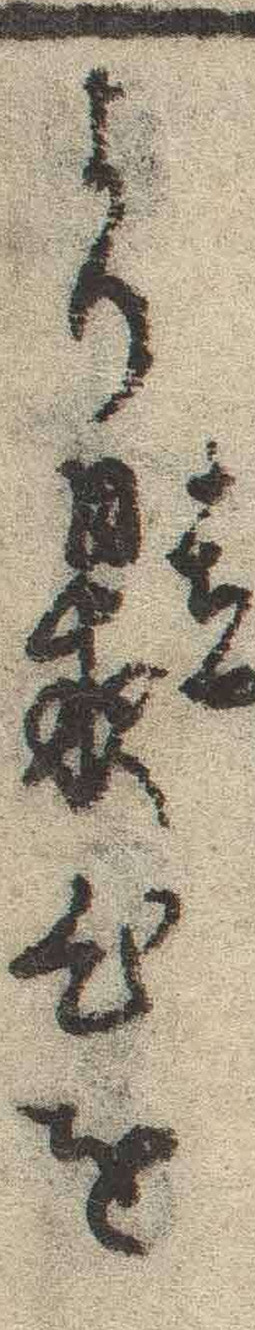より日夜心を
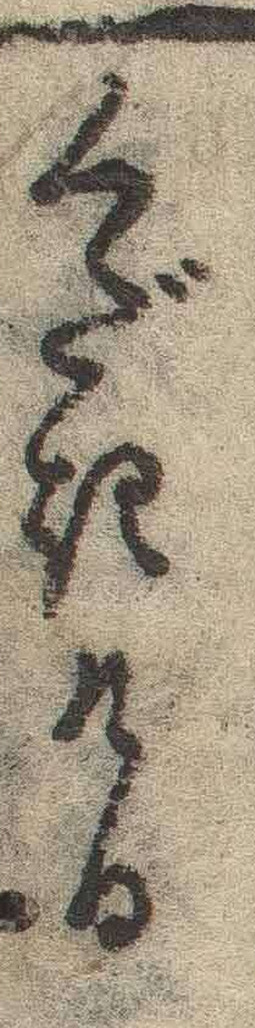くだきける

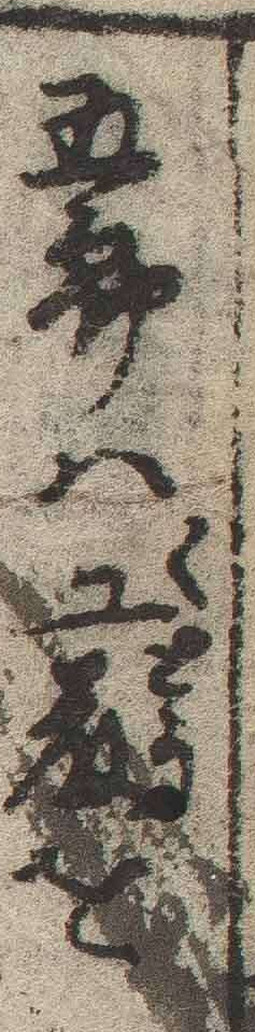五郎は工藤を
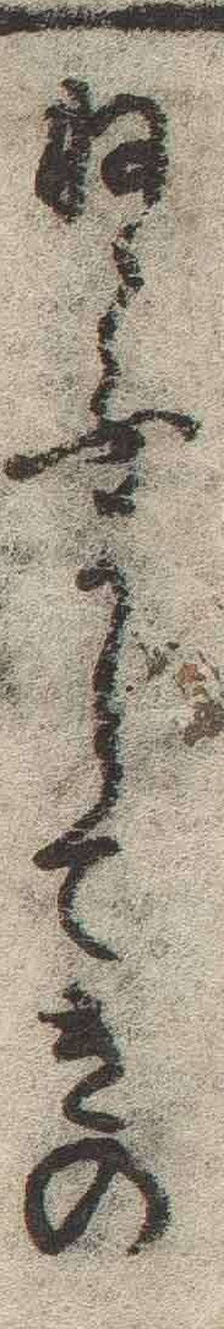ねらふよしてきの
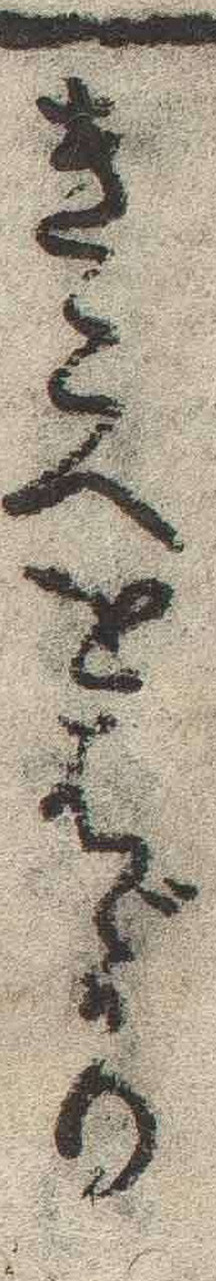きこへをはゞかり
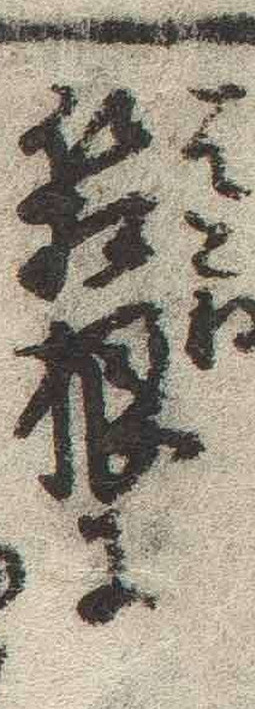箱根に
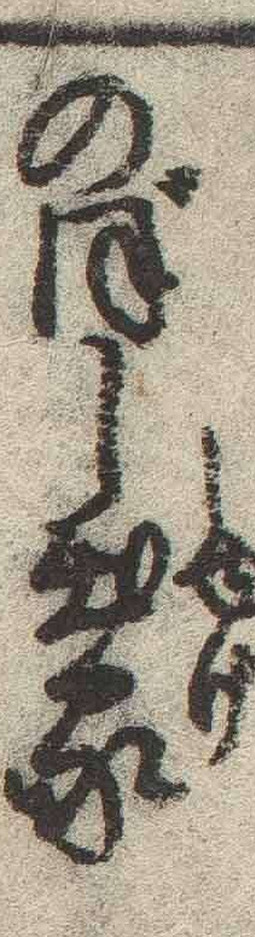のぼし出家
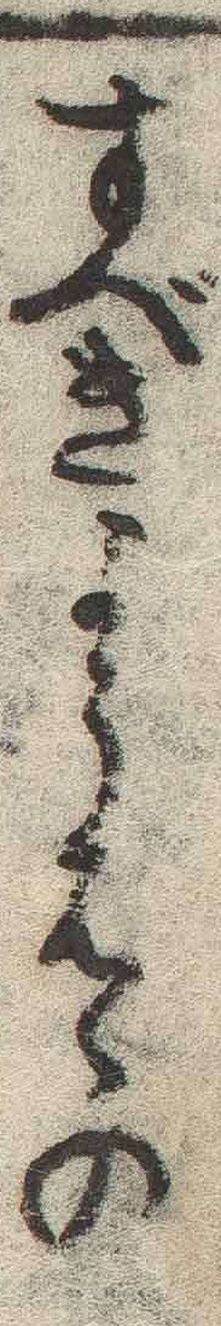すべきようはゝの
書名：末広扇
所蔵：東京学芸大学附属図書館 国文学研究資料館
